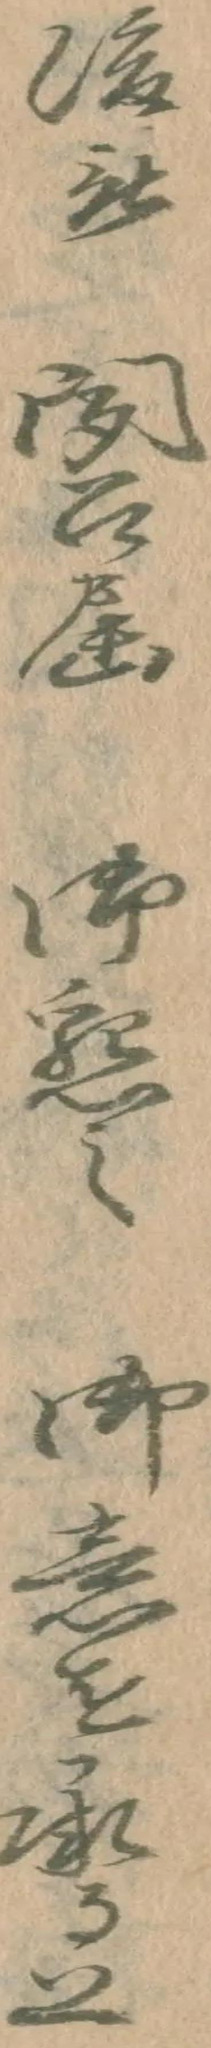後被聞召届御懸之御意を承る上
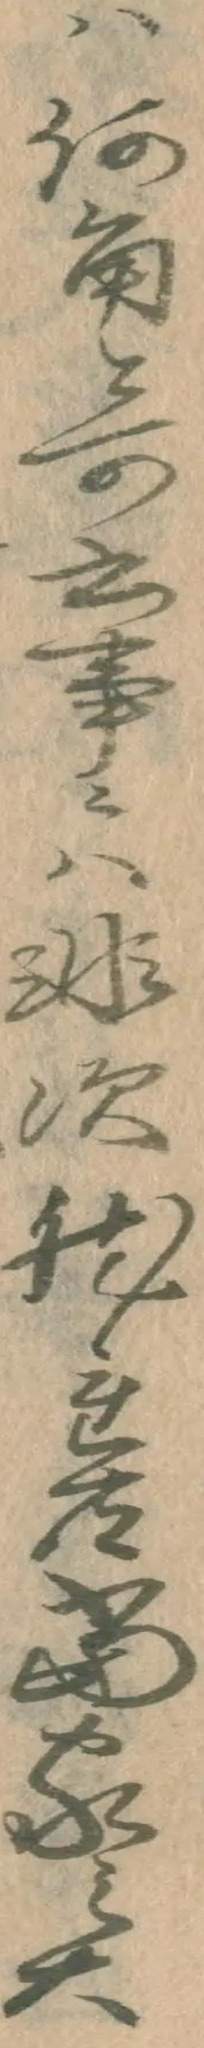は何角と可云事には非次然連共当家に大
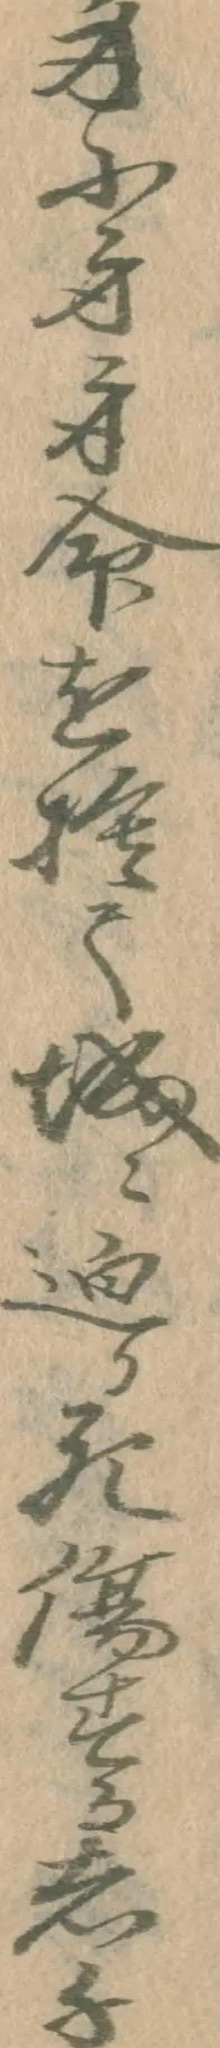身小身身命を捨て城に迫り死傷春る者千
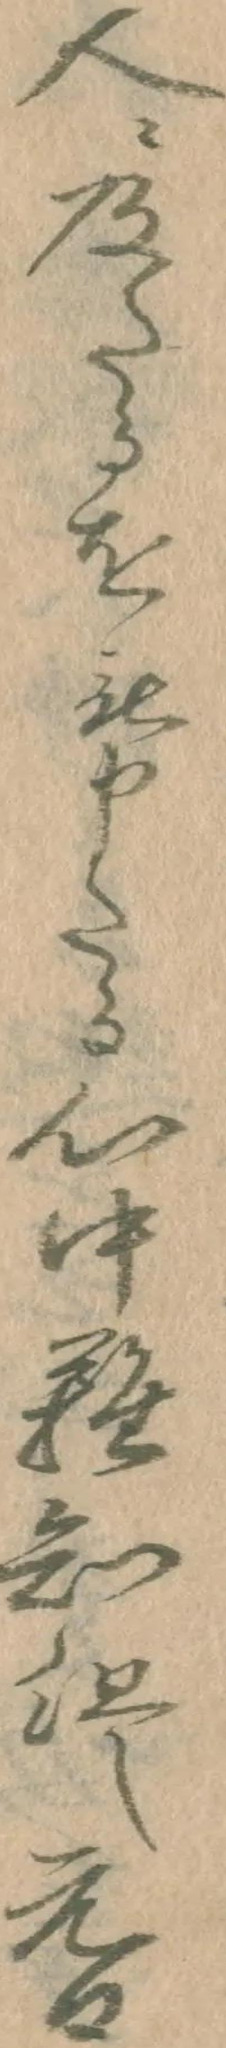人に及たるを被申たる心中難知但し元日
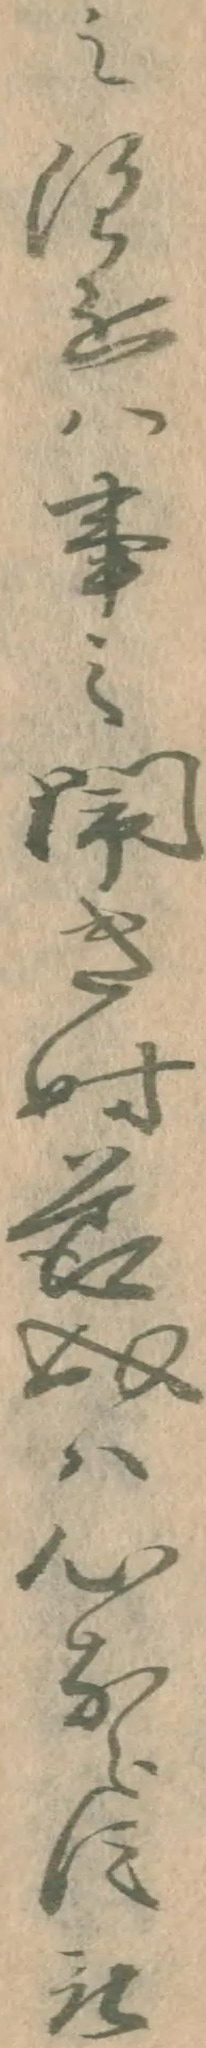之注進は事之鬧き時節成は心なら須被
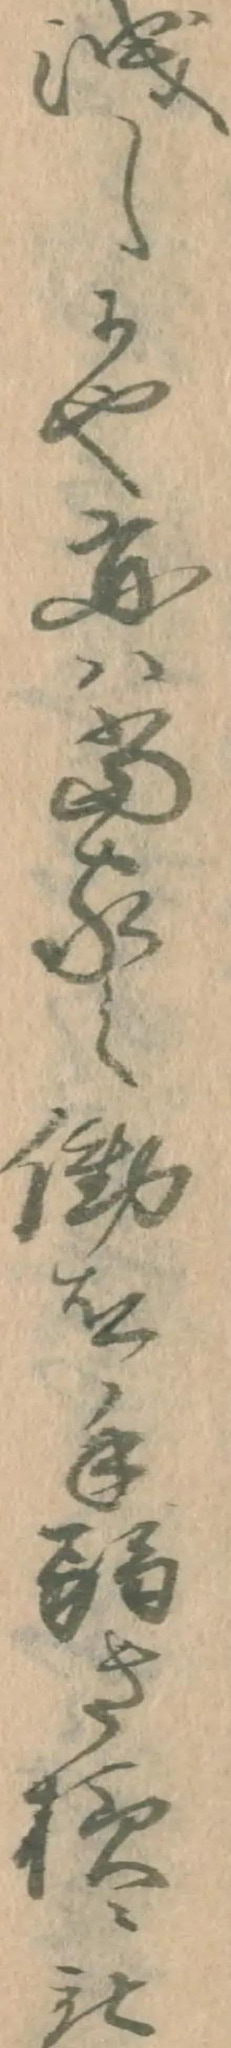洩し尓也亦は当家之働を手弱き様に被

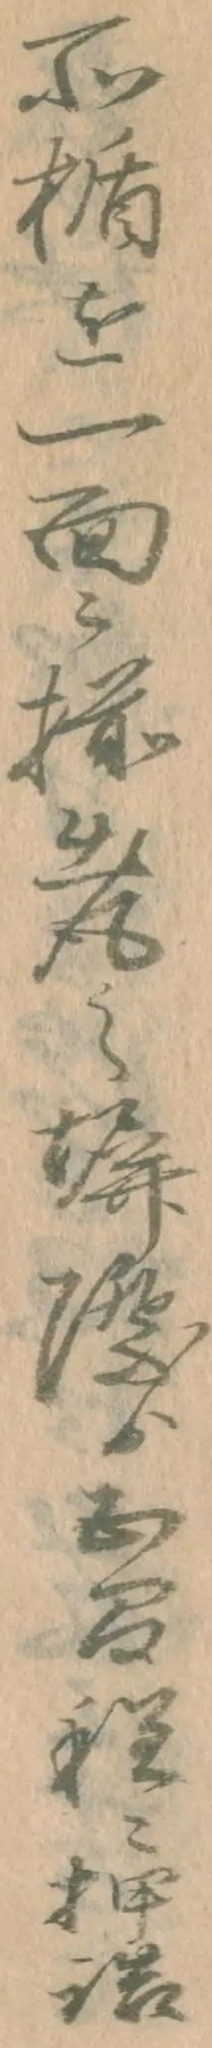所楯を一面に揃出丸之塀際ゟ五間程に押詰
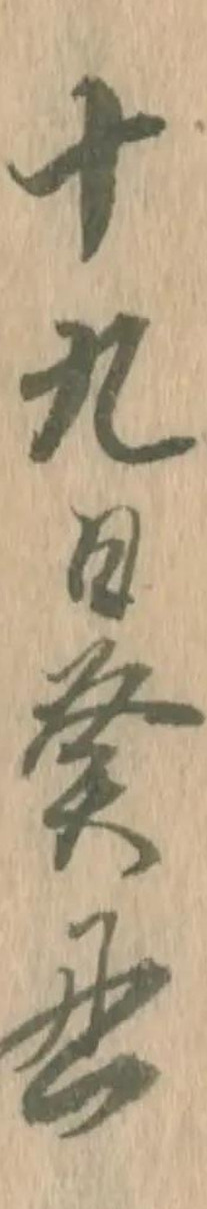十九日癸丑
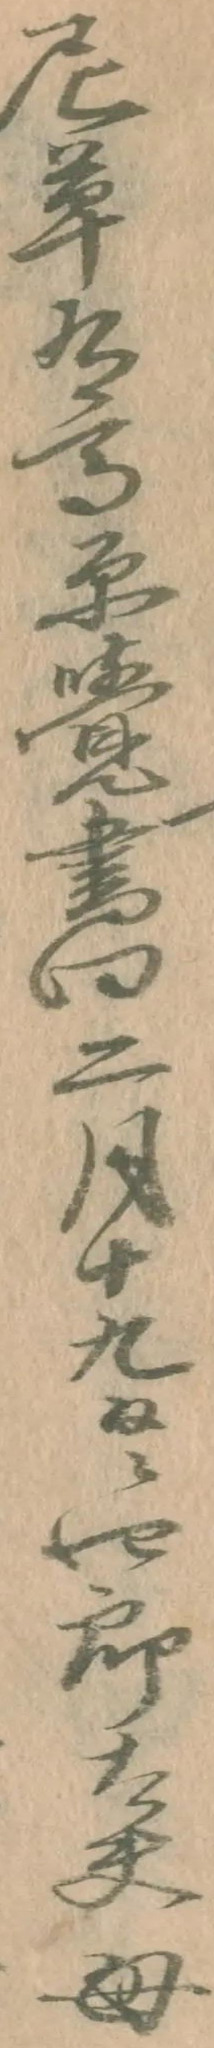尼草有馬原御覚書曰二月十九日に四郎太夫母
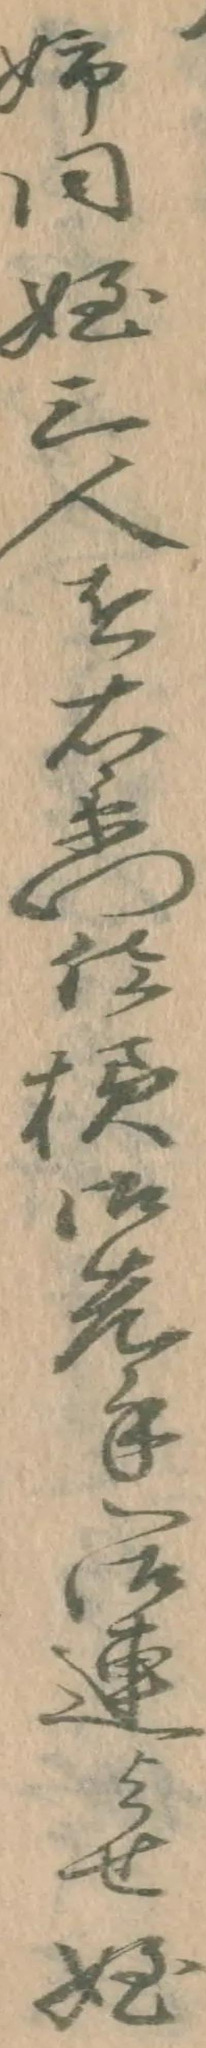姉働姪三人を右衛門佐様御先手へ御連与せ姪
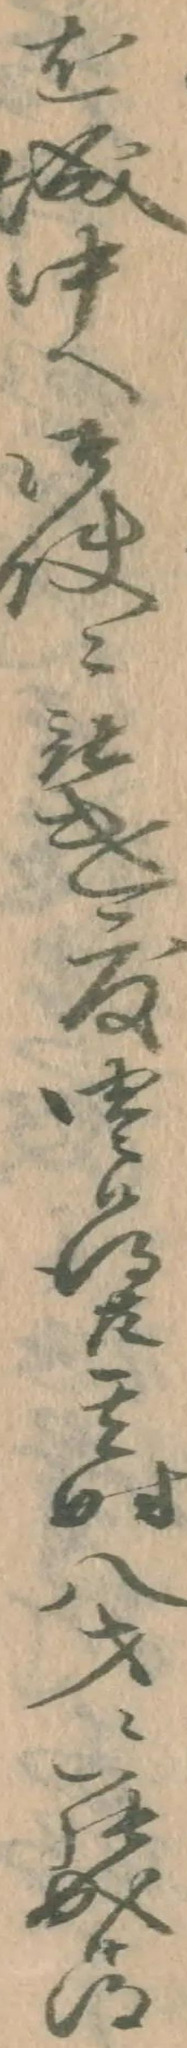を城中へ御使に被遣度由に候得共其時八才に罷成候得
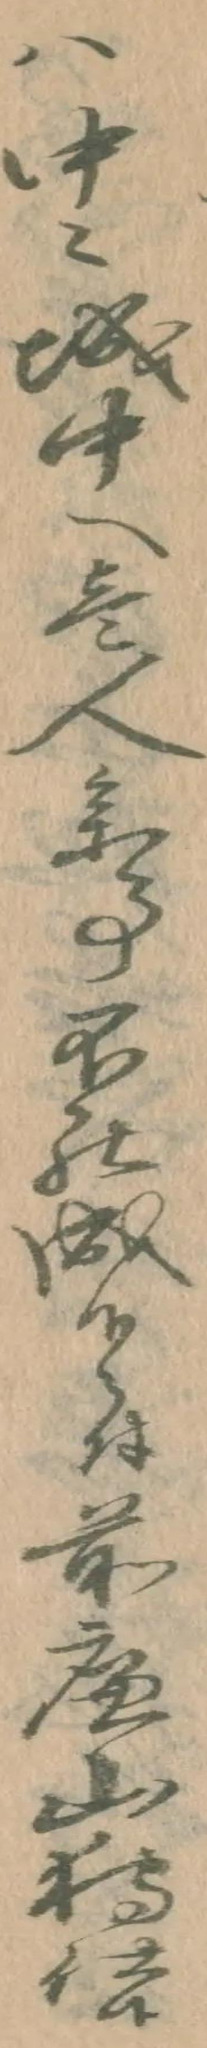は中々城中へ壱人参事不罷成候に付前広山狩仕候
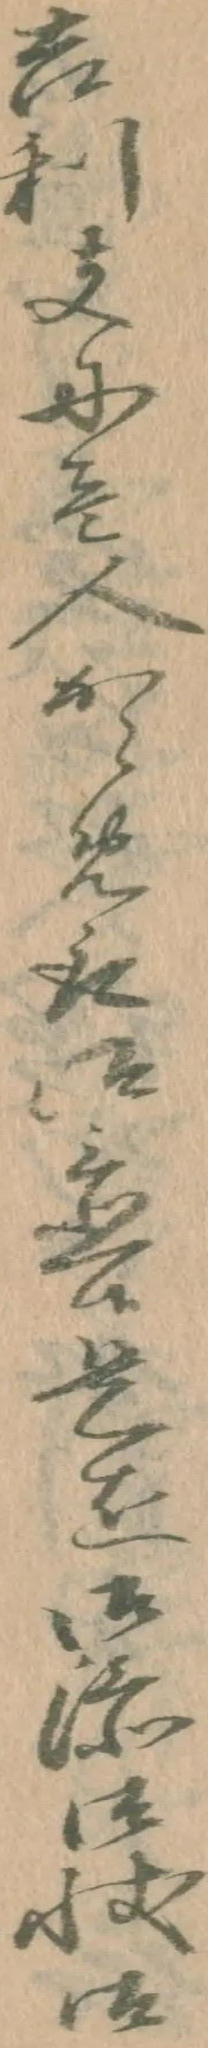吉利支丹壱人から免取御置候是を御添御状御
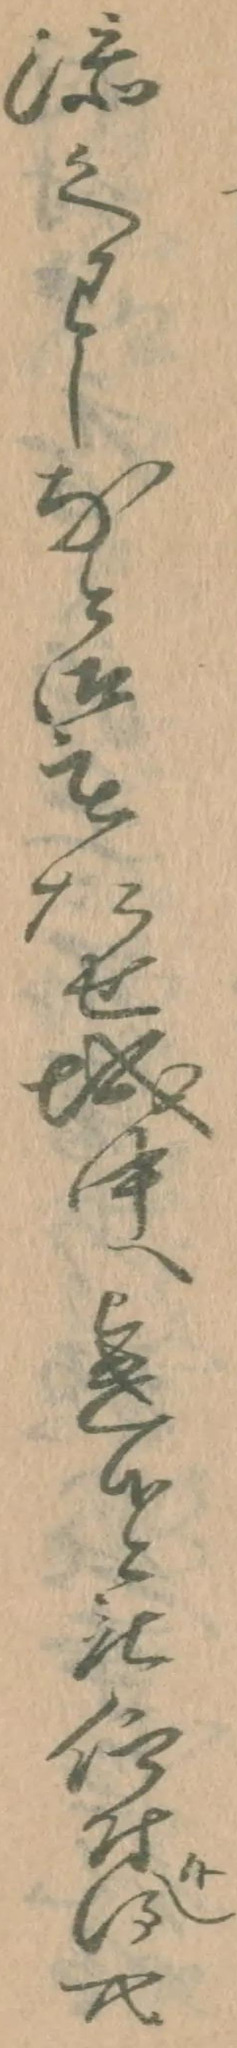添くわしなと御もたせ城中へ被遣候と被仰付候得共
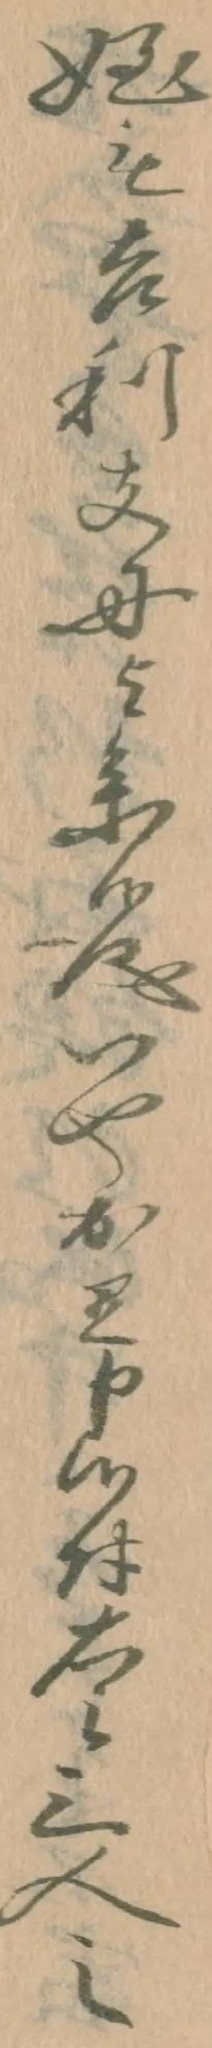姪を吉利支丹与参候儀いやか里申候付右之三人之
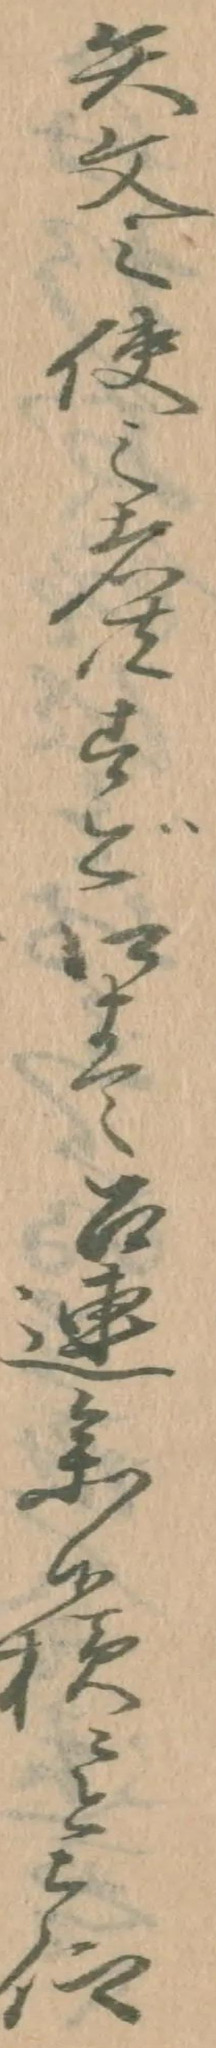矢文之使之者共春ど口まて召連参候様にと被仰
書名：切支丹御退治記 49巻. [6]
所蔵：国立国会図書館 National Diet Library, JAPAN
